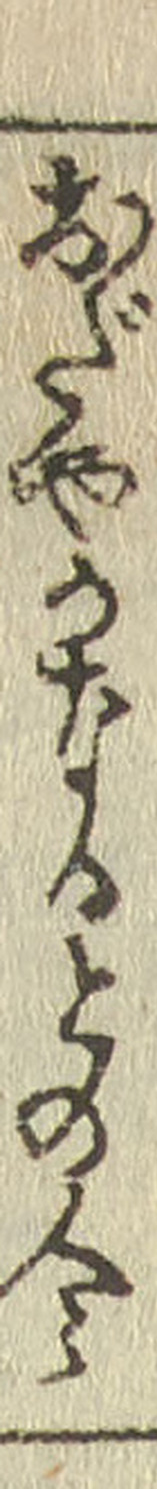おだやかなるとの人〻
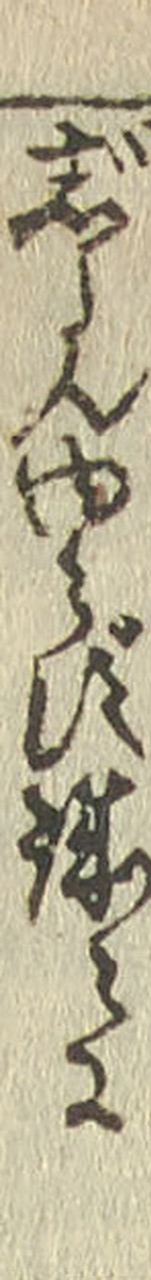じしんゆらず誠ニか
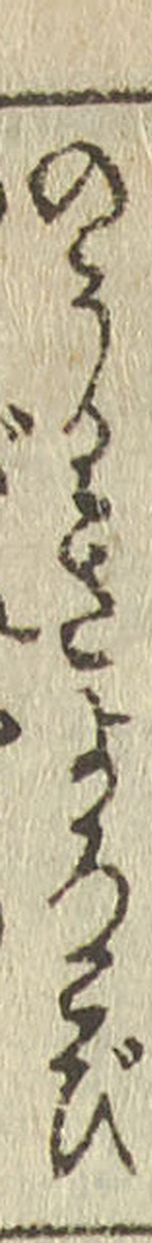のうわさよろこび
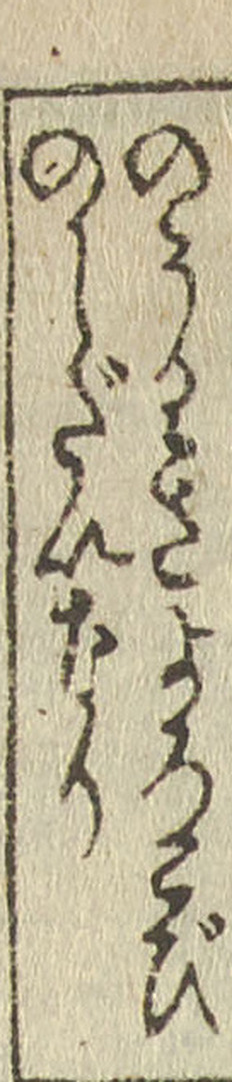のしだいなり
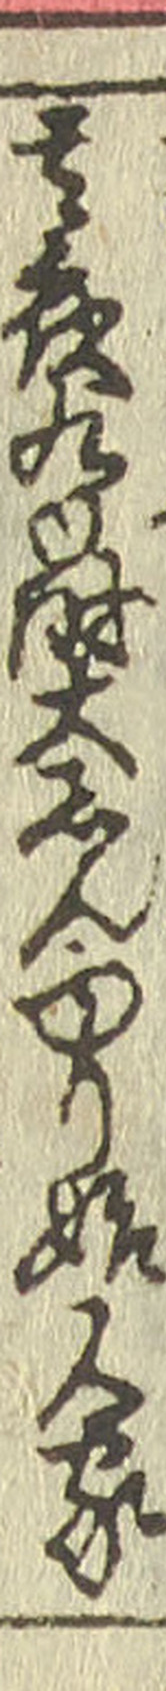其夜九ツ時大しんゆり始人家
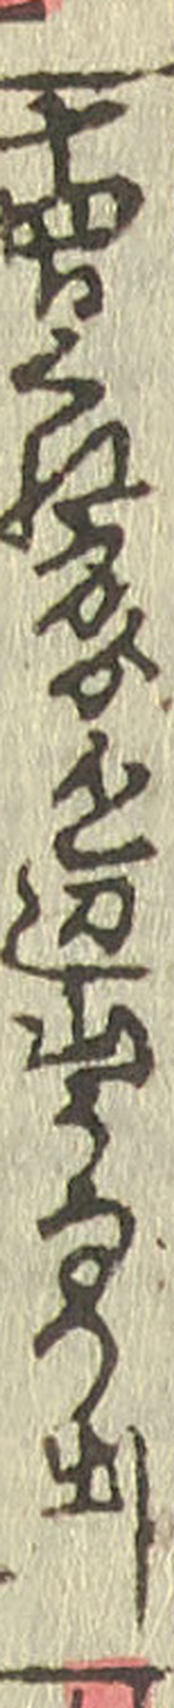十四日くれ方ゟ近辺山うなり出し
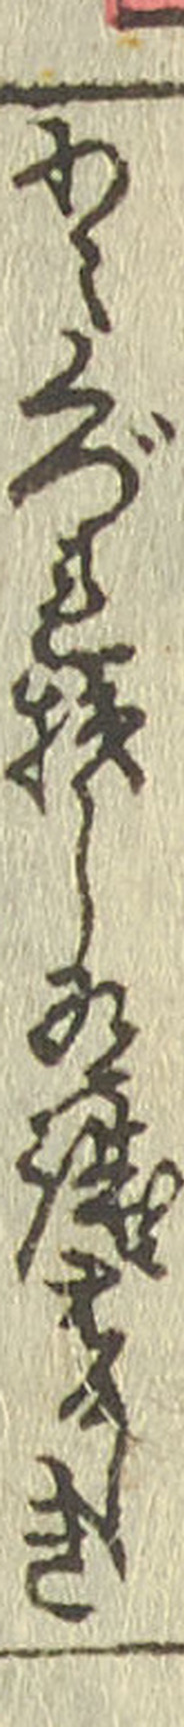少〻くづれ損し有焼はげしき
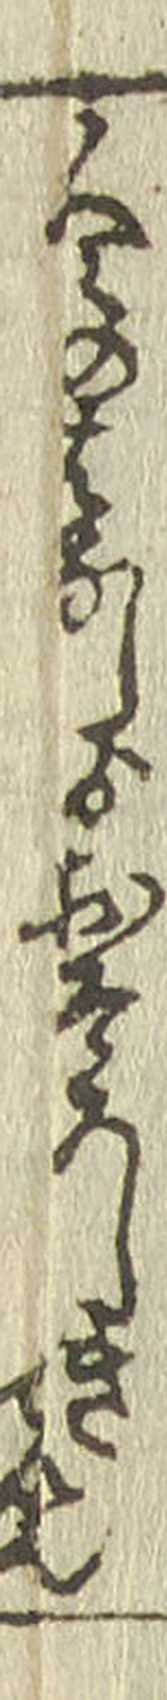人〻のはなしゟおそろしき者也
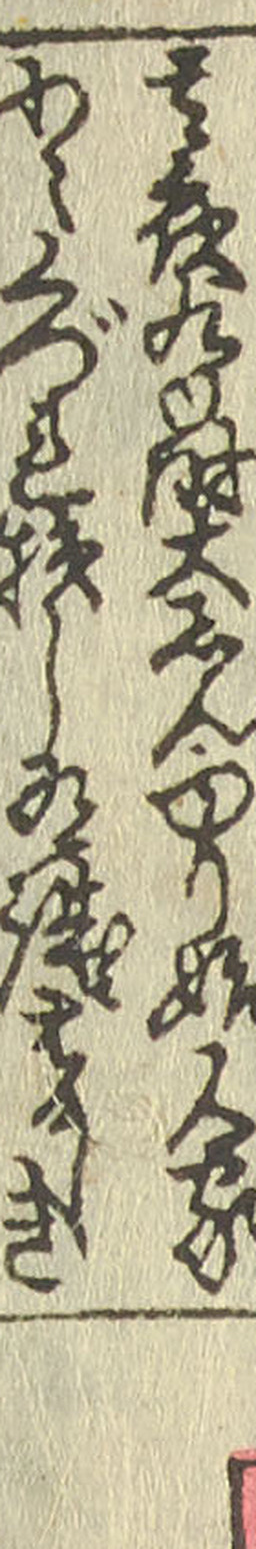少〻くづれ損し有焼はげしき
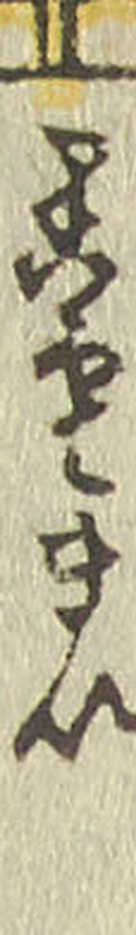黒雲まい
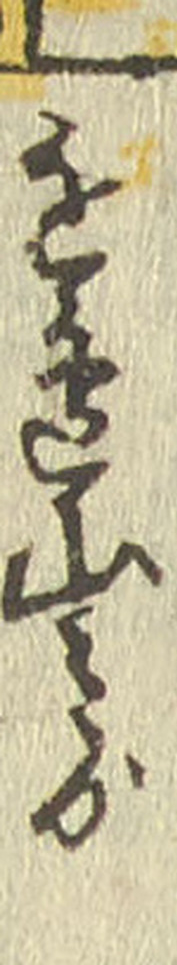近邊山〻ゟ
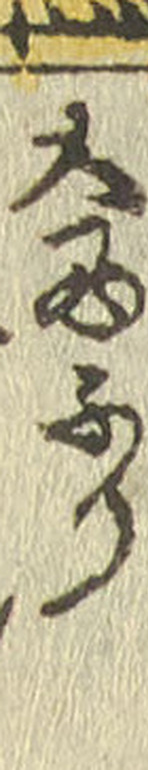大雨ふり
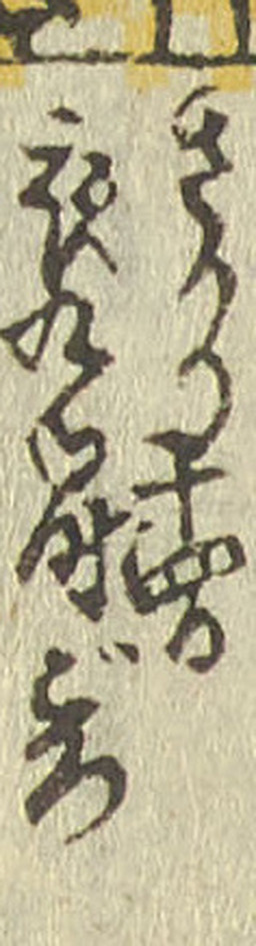夜九ツ時ごろ
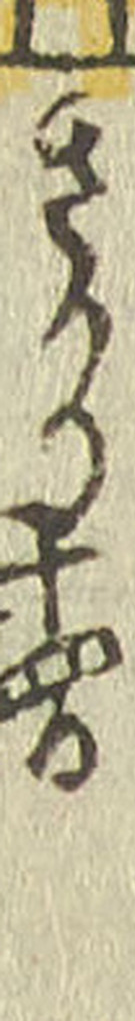さかり十四日
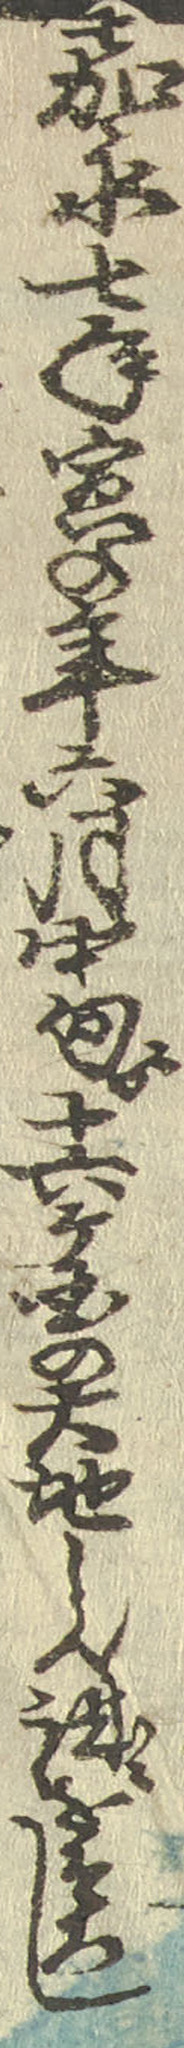嘉永七年寅の年六月中旬ゟ十六ヶ国の大地しん誠ニをそろし
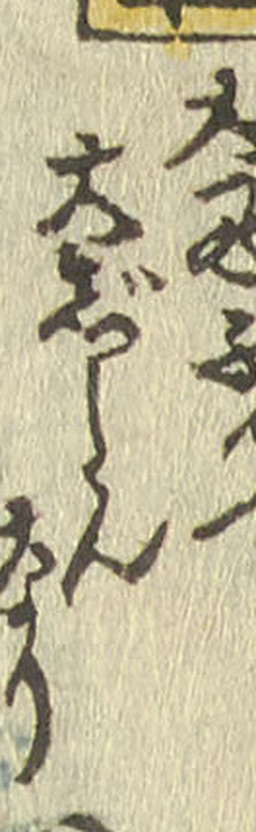大じしんなり
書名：大地震早引方角附
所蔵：東京大学総合図書館 General Library in the University of Tokyo, JAPAN
